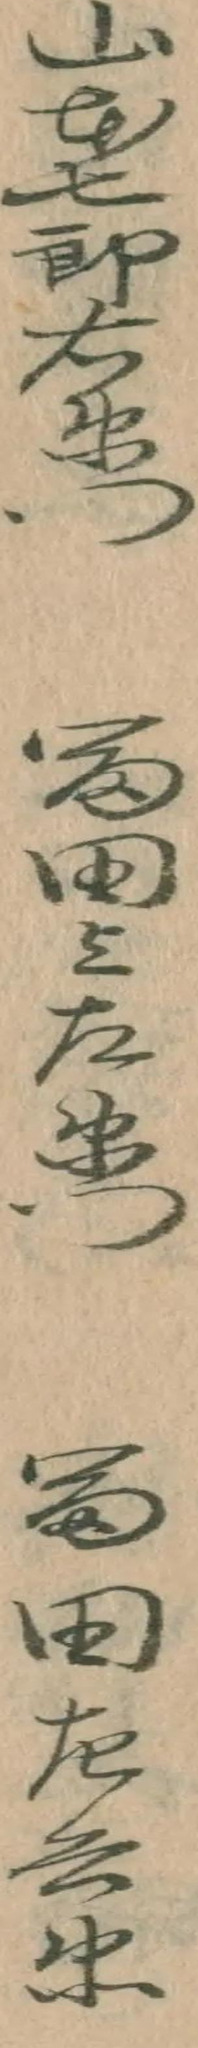山本七郎右衛門富田与左衛門富田左兵衛
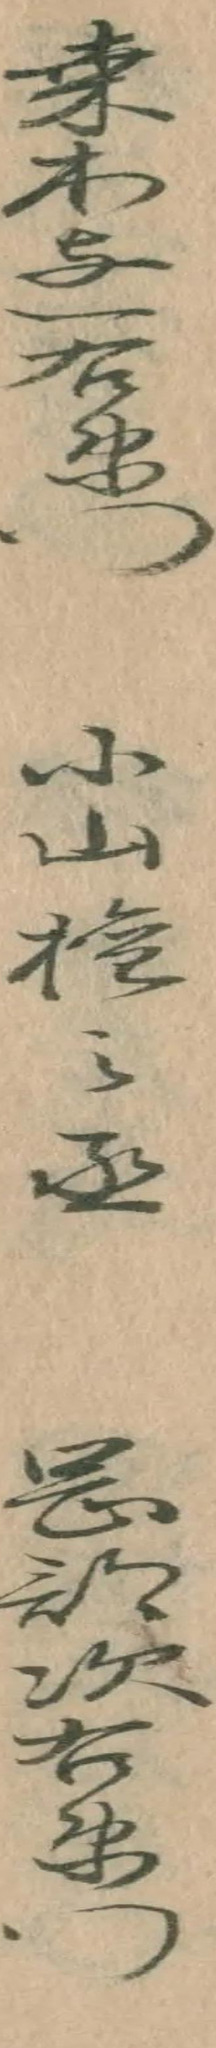桑木与一右衛門小山権之丞岡部次右衛門
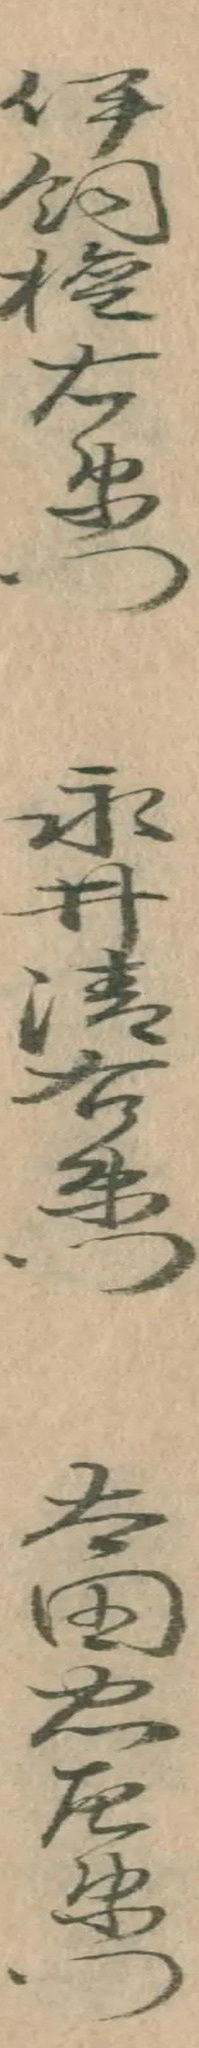伊飼権右衛門永井清右衛門太田忠左衛門
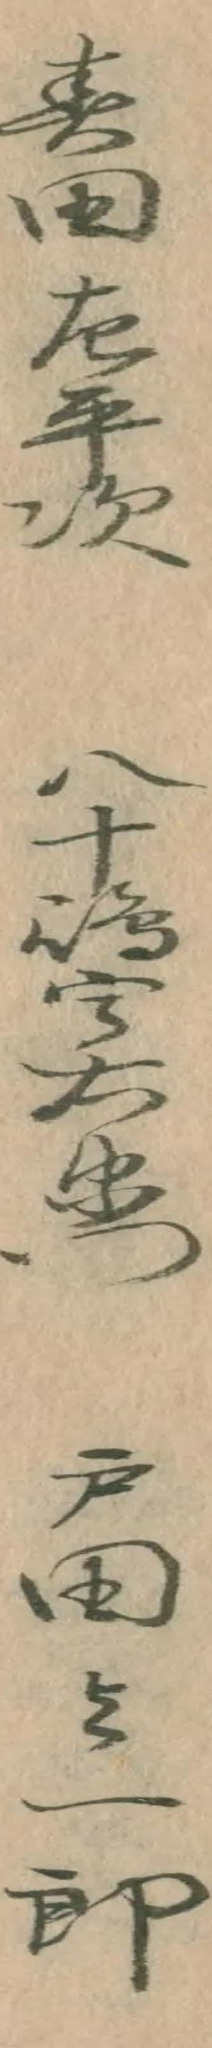春田左平次八十島宇右衛門戸田与一郎
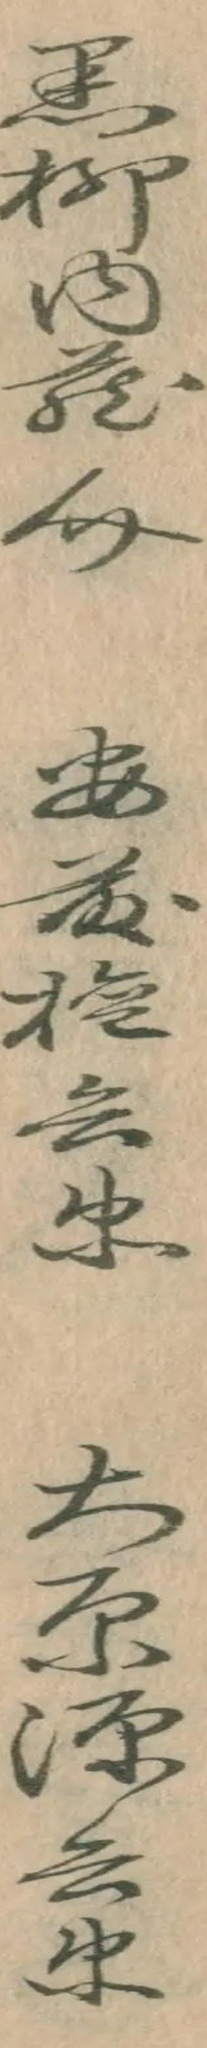黒柳内蔵介安藤権兵衛大原源兵衛
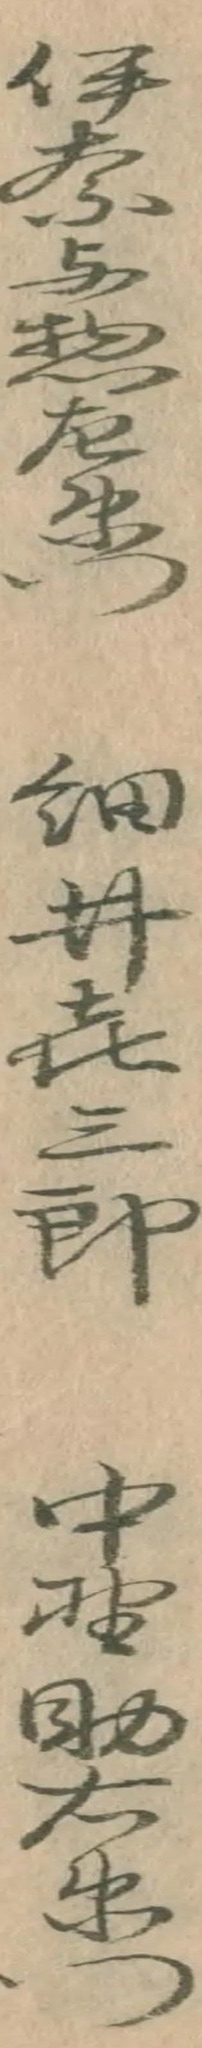伊奈与惣左衛門細井喜三郎中野助右衛門
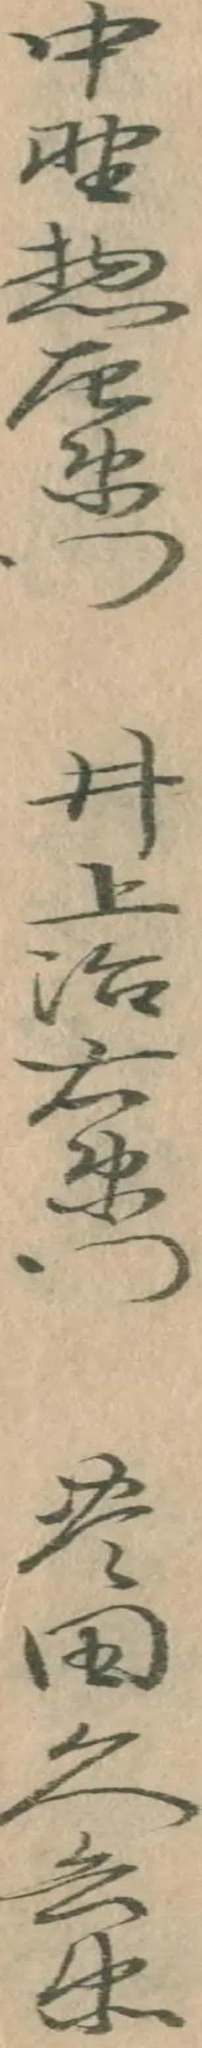中野惣左衛門井上治右衛門豊田久兵衛

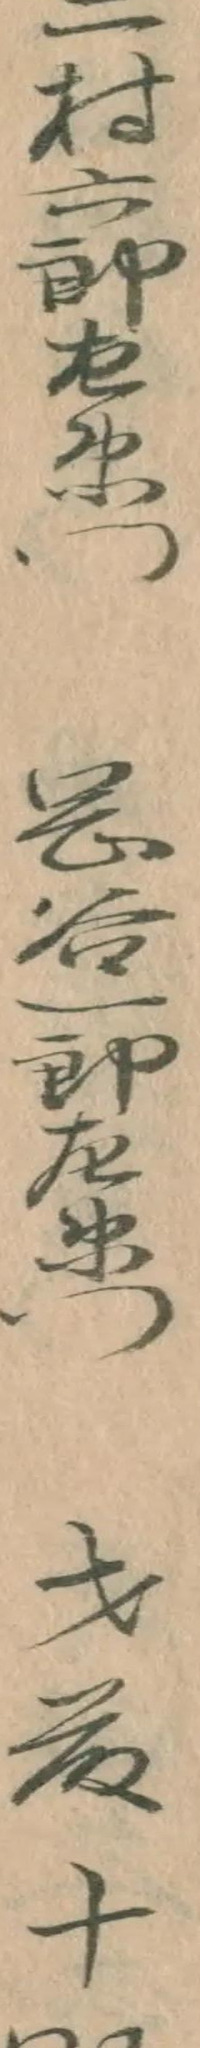三村六郎左衛門岡谷一郎左衛門才藤十助
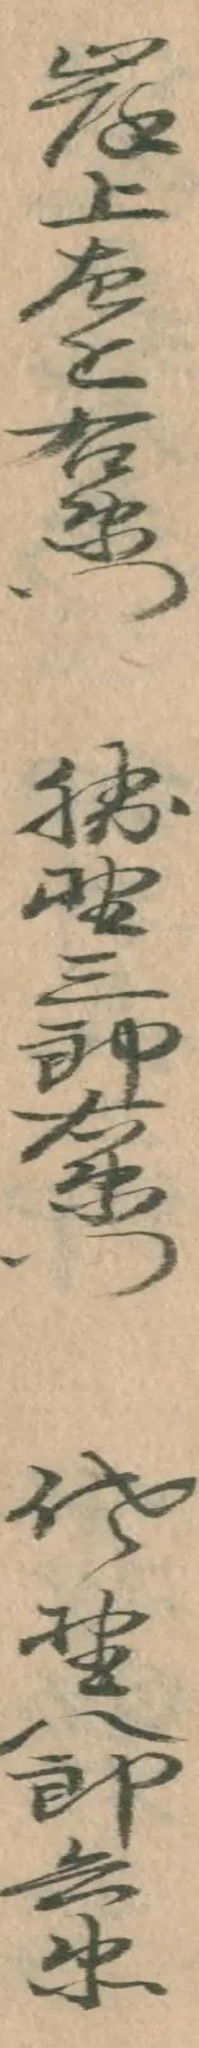岸上左近右衛門勝野三郎右衛門佐野八郎兵衛
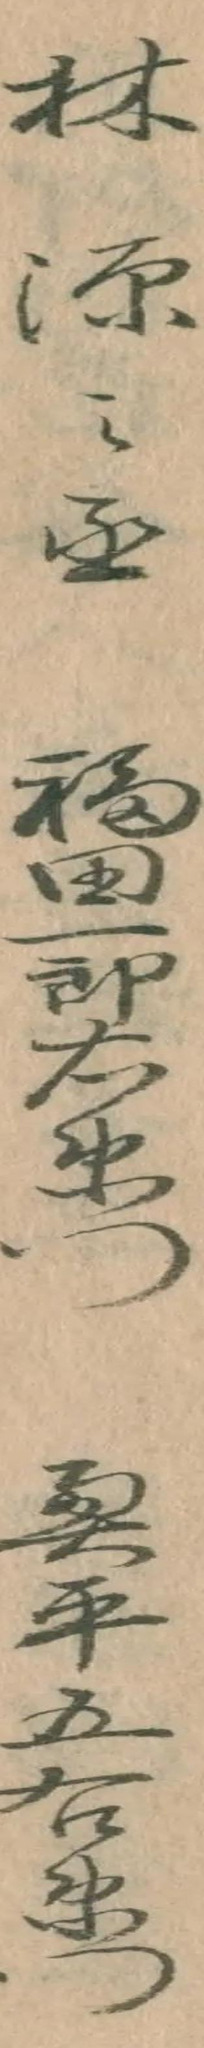林源之丞福田一郎右衛門奥平五右衛門
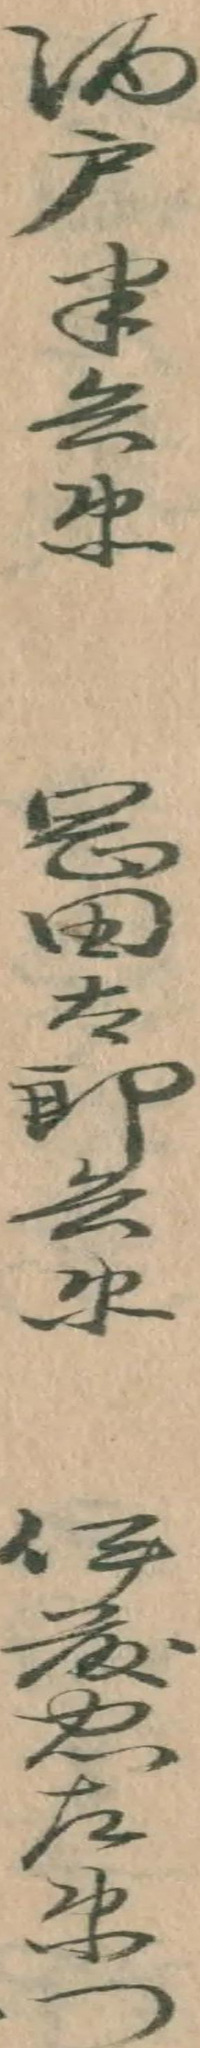酒戸半兵衛岡田太郎兵衛伊藤忠左衛門
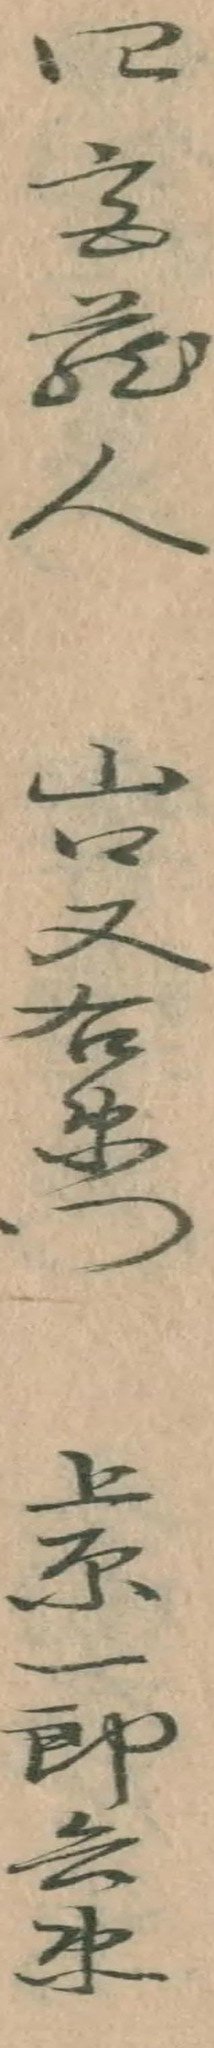四宮蔵人山口又右衛門上原一郎兵衛
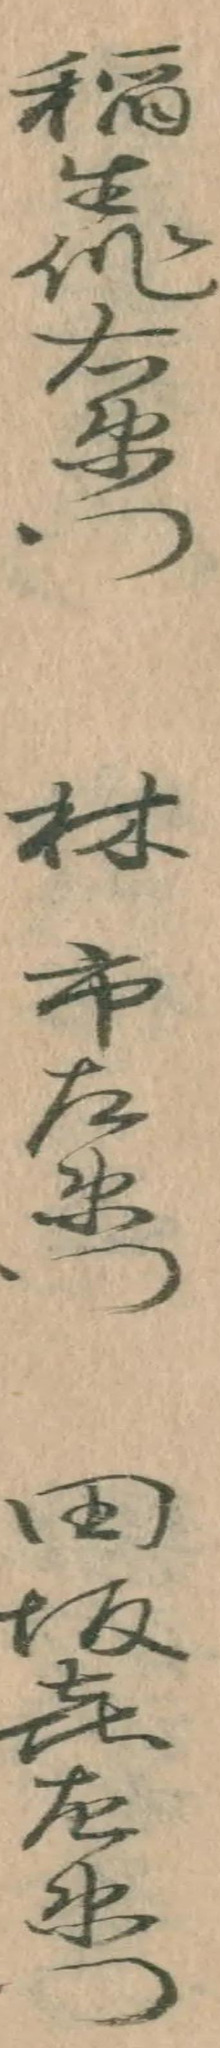稲生作右衛門林市左衛門田坂喜左衛門
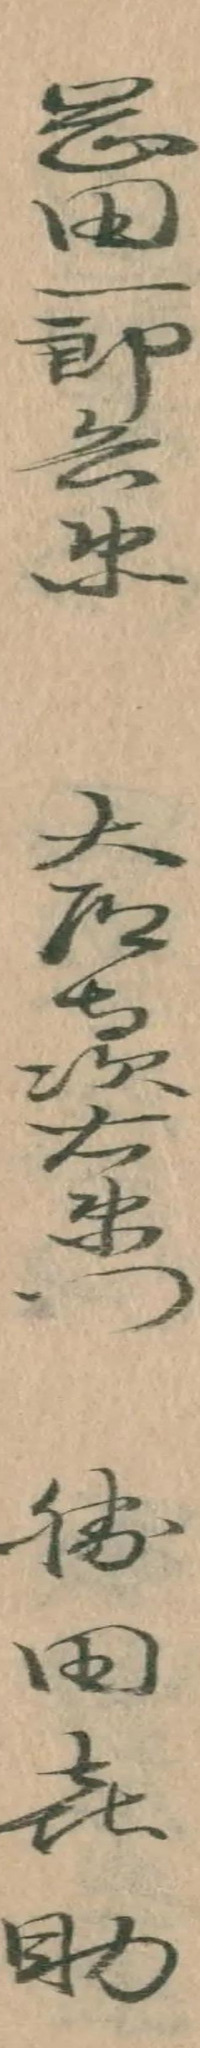岡田一郎兵衛大道寺次右衛門勝田喜助
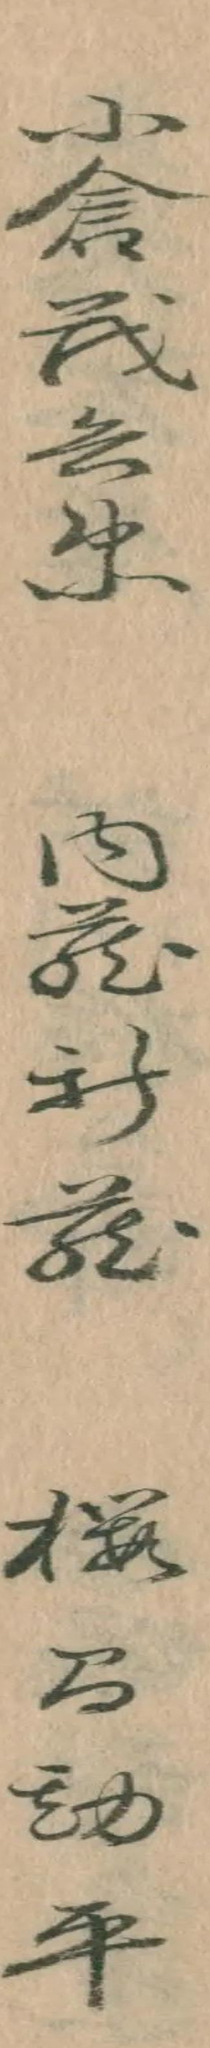小倉茂兵衛内蔵新蔵桜間勘平
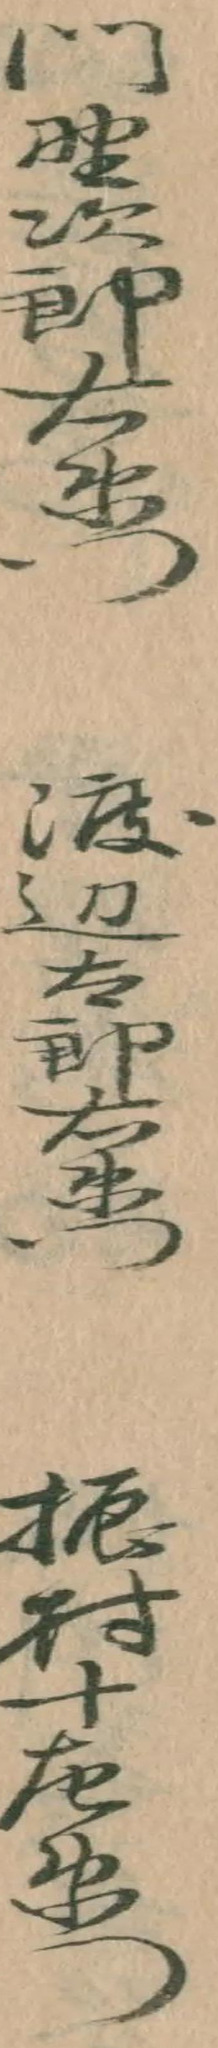門野次郎右衛門渡辺太郎右衛門振村十左衛門
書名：切支丹御退治記 49巻. [3]
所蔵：国立国会図書館 National Diet Library, JAPAN
